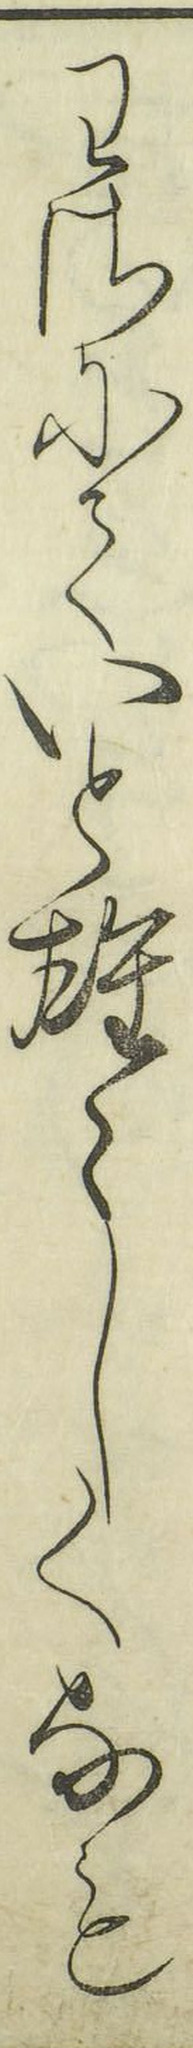わさにていと雄ゝしくなも

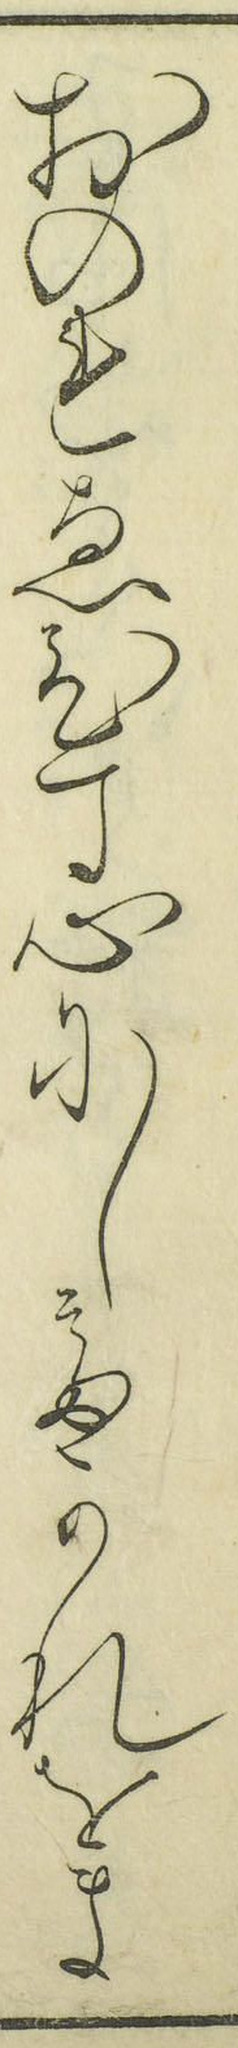おのれゑひす心にしてかれをま
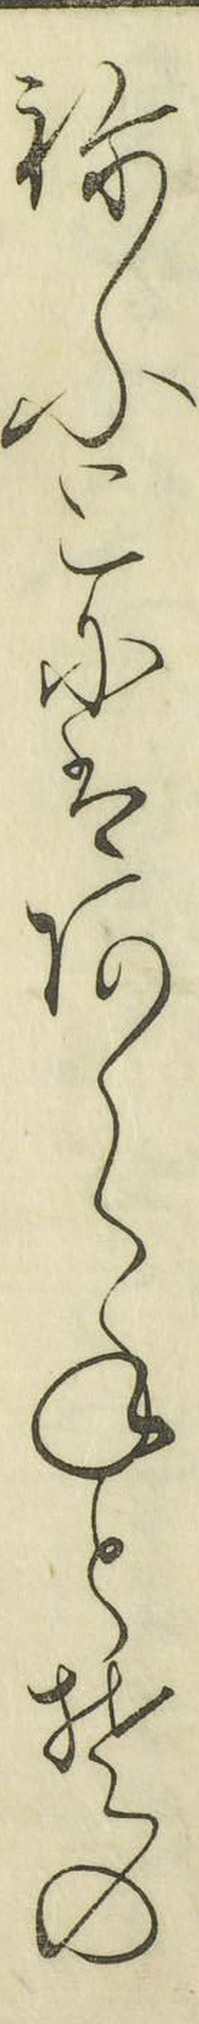ねふとにはあらねとその
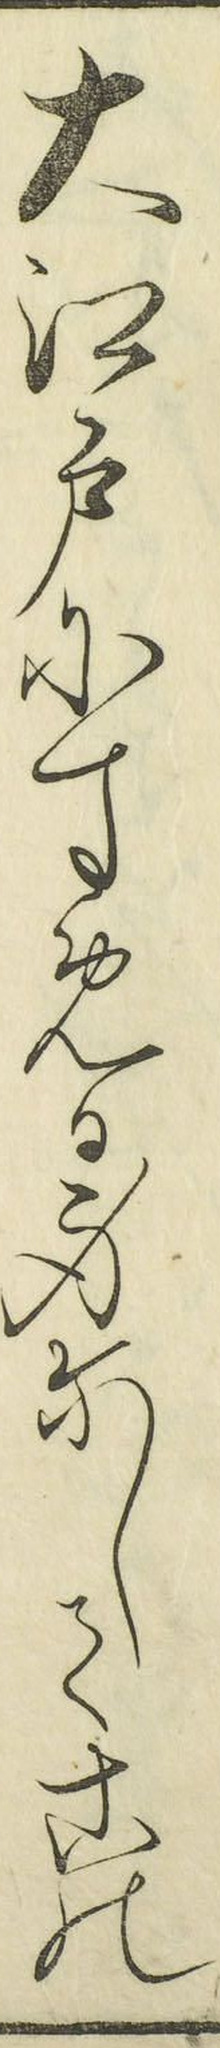大江戸にすめる身にしてこの
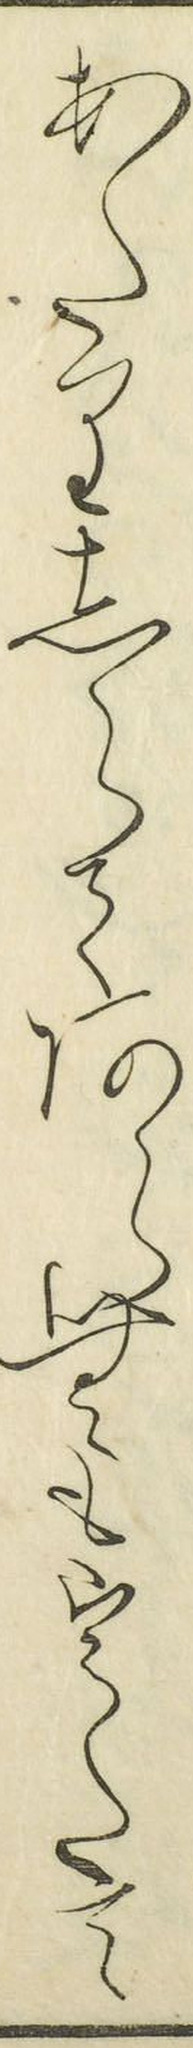あたりしらてあらむもうたて
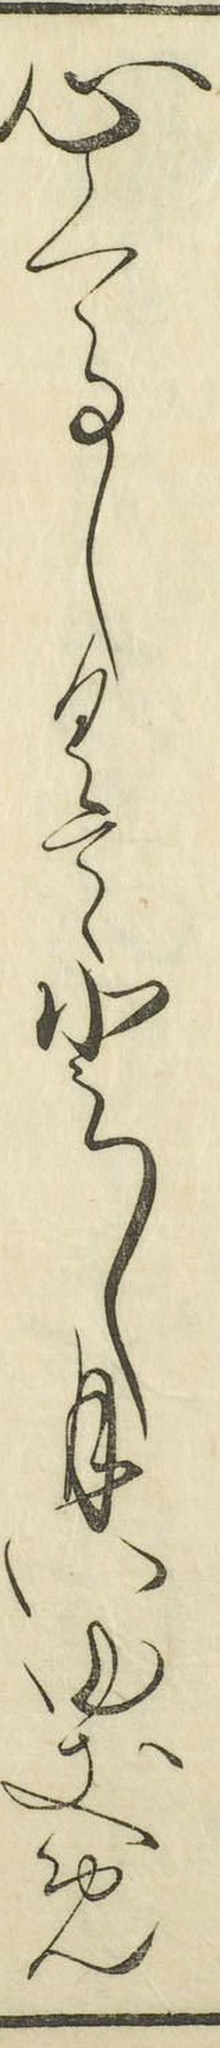心くるしくてとし月いゆきめ
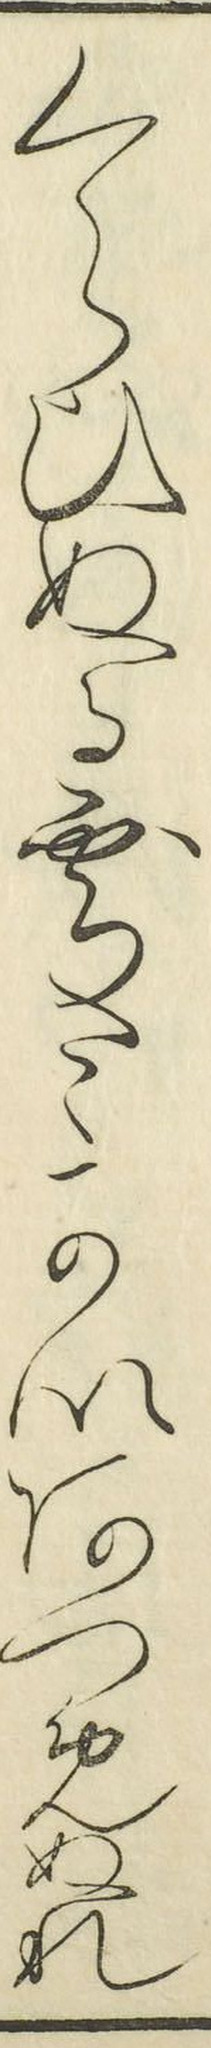くらひぬる処ゝかいあつめぬれ
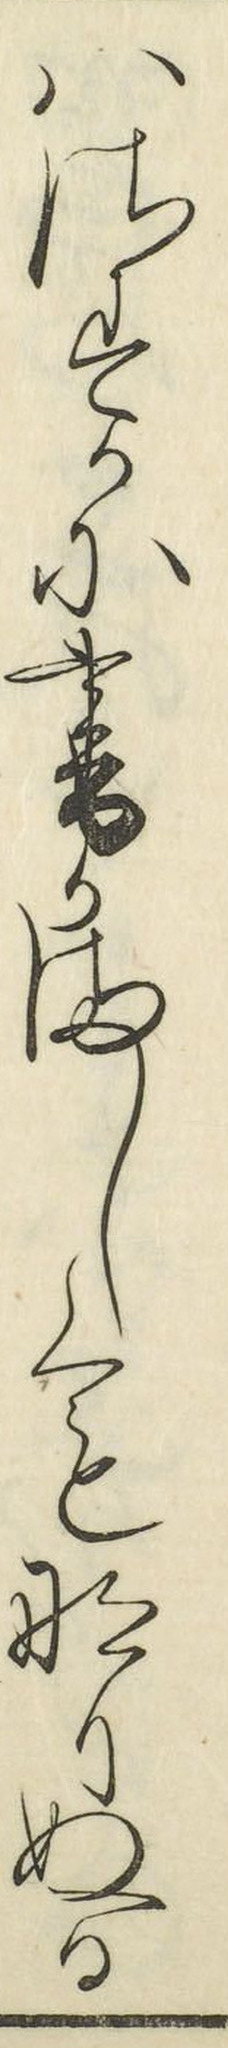はさすかに書かましくもなりぬる
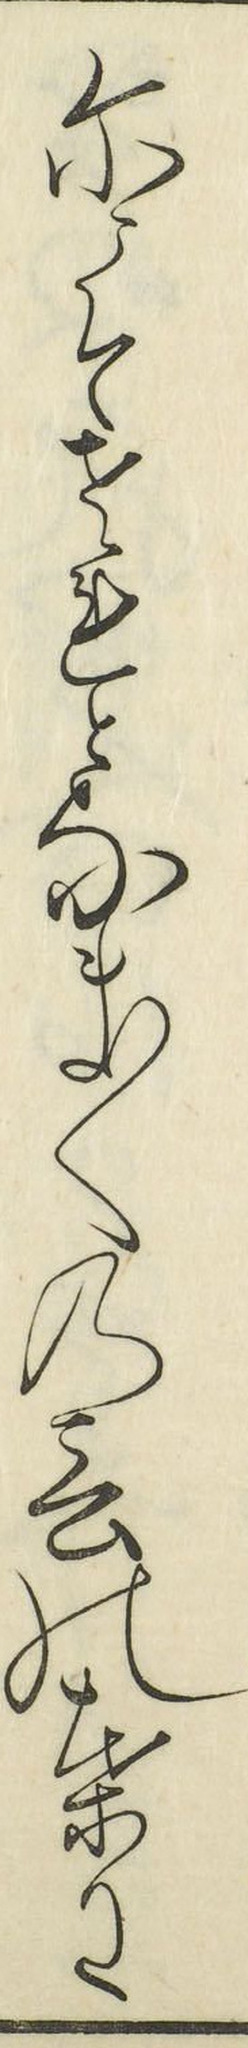にこそされとなま〳〵の言の葉に
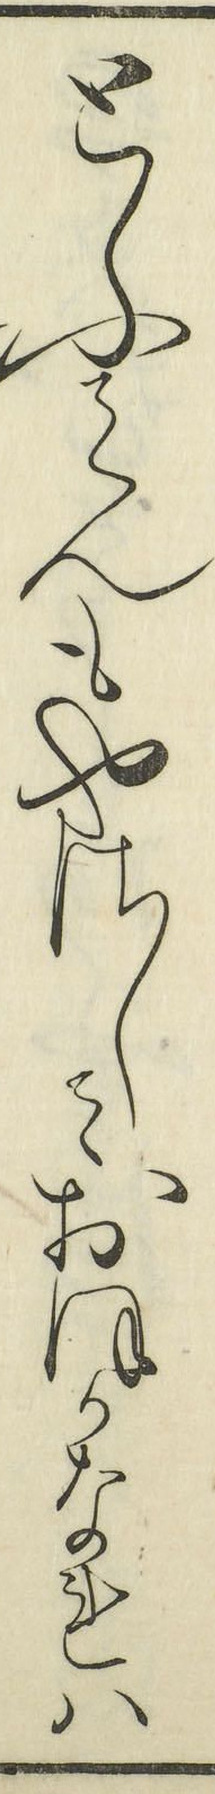とふてんもやさしみおほかなれは
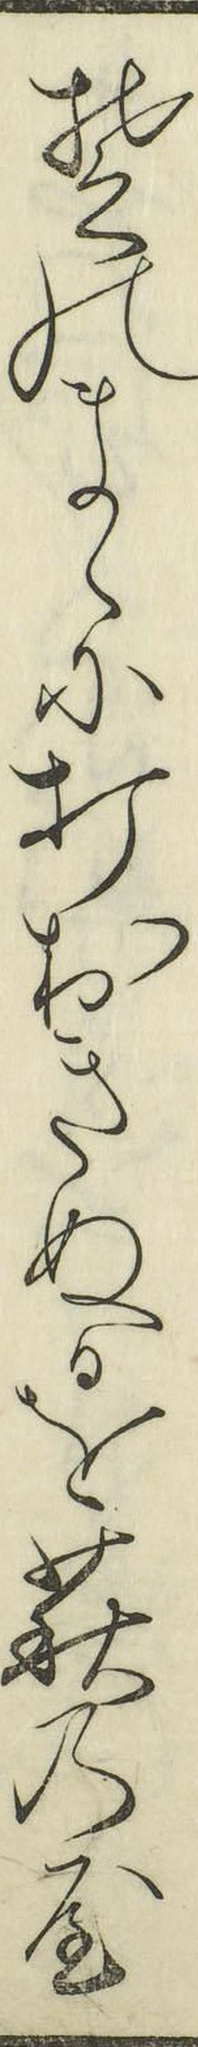そのまゝに打おきぬるを萩の屋
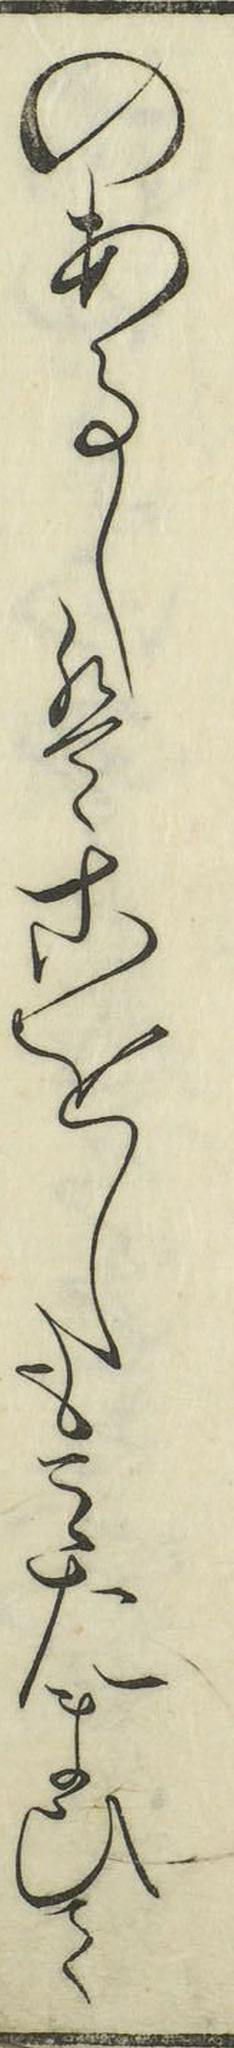のあるしはこをしもみたまひて
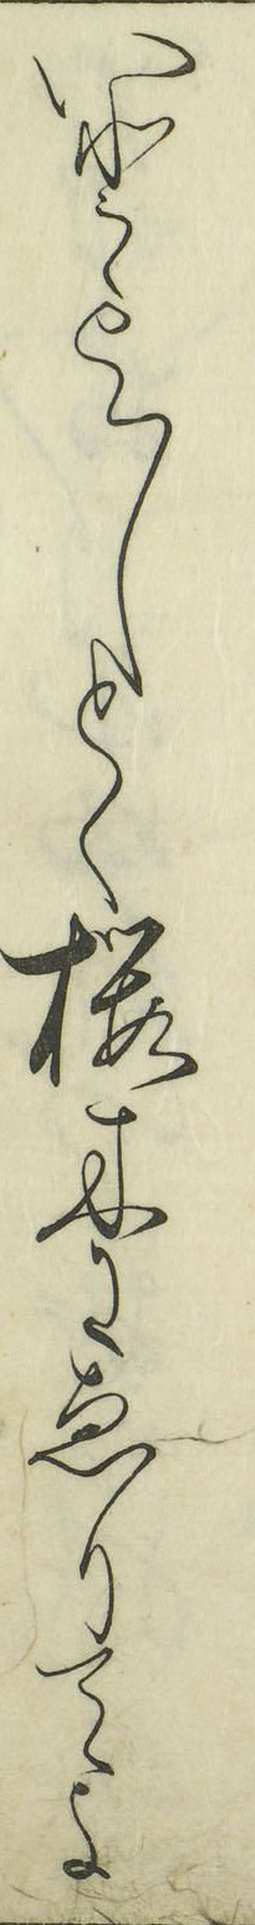いとゝよしとく桜木はゑりてよ

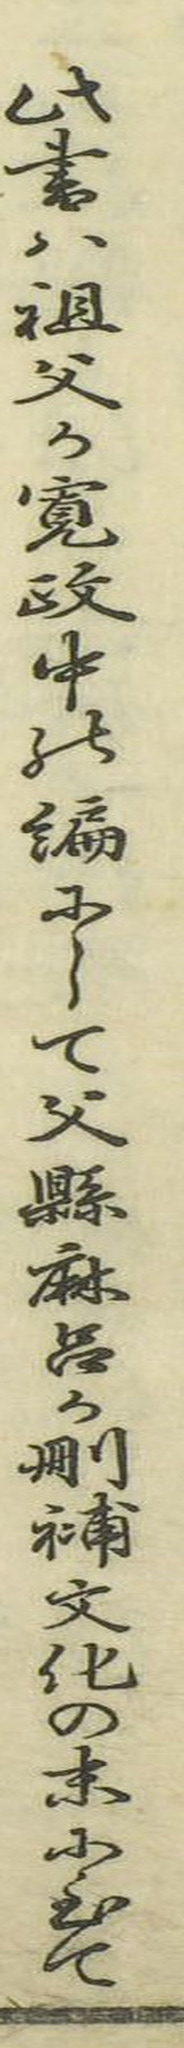此書は祖父か寛政中の編にして父縣麻呂か刪補文化の末に至て
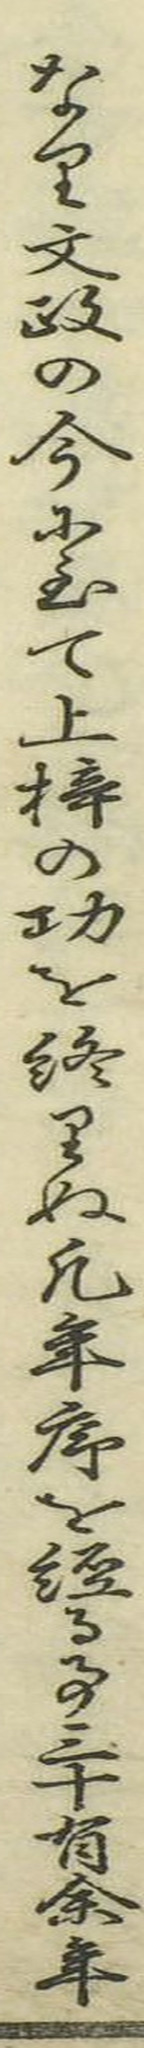なり文政の今に至て上梓の功を終りぬ凡年序を経る事三十有余年
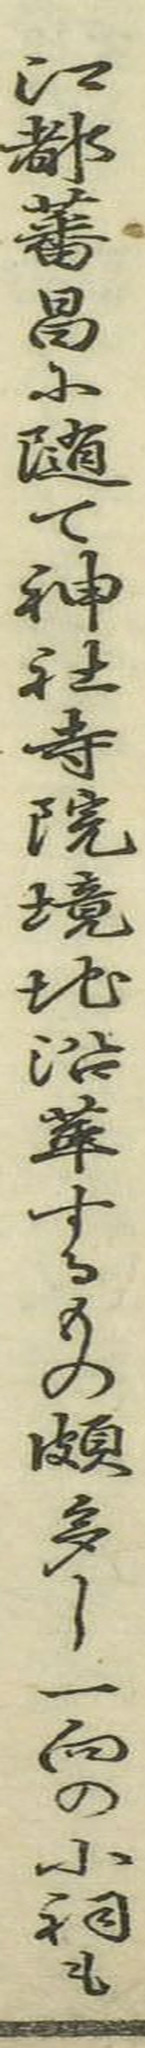江都蕃昌に随て神社寺院境地沿革するもの頗多し一向の小祠も
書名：江戸名所図会 20巻 巻之1
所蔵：東京学芸大学教育コンテンツアーカイブ
